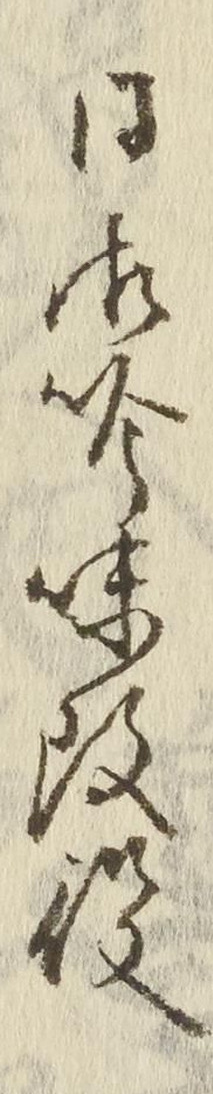同御吟味改役
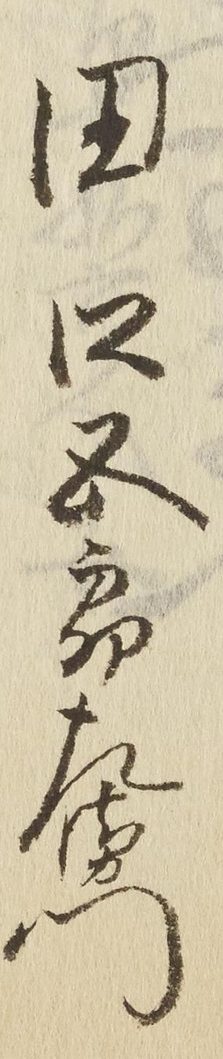田口五郎左衛門
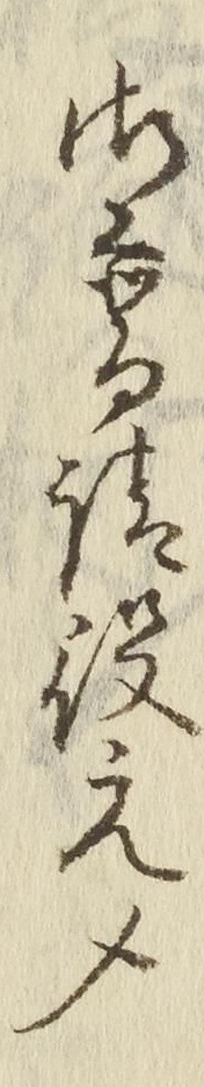御普請役元〆
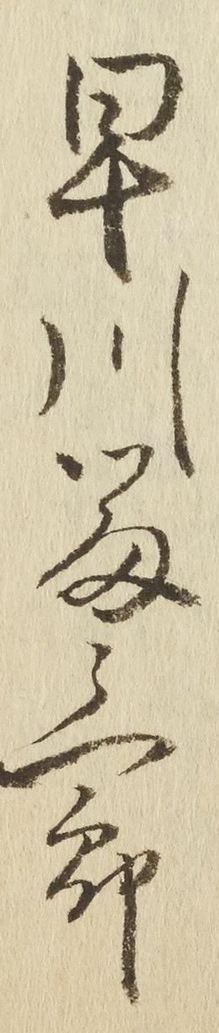早川留三郎
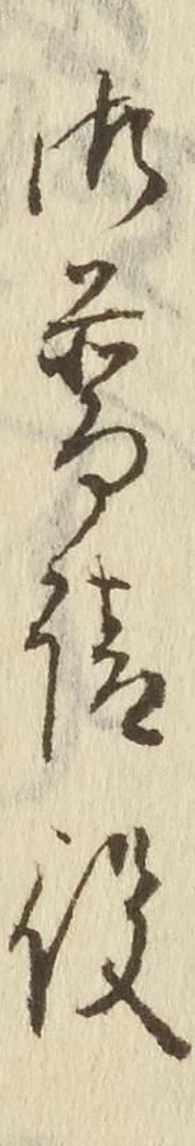御普請役
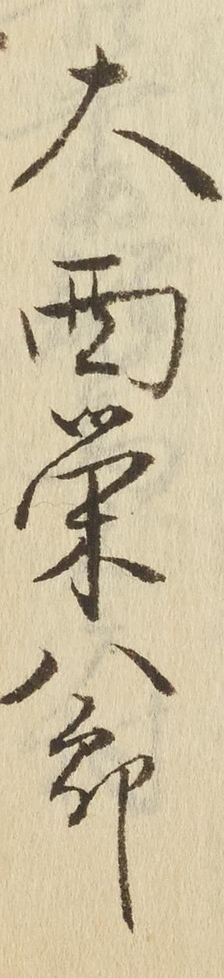大西栄八郎
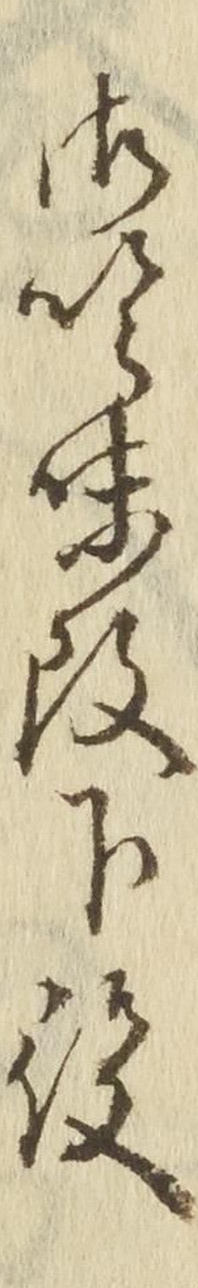御吟味改下役
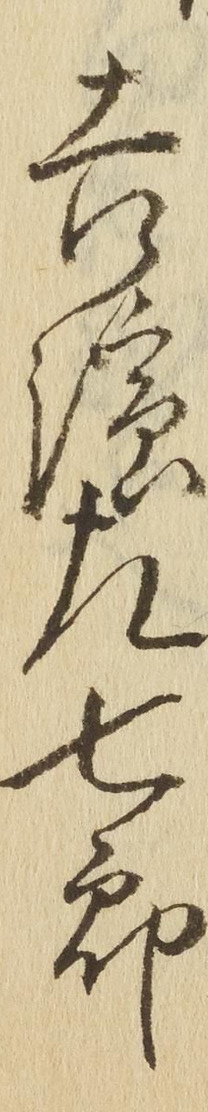吉浜左七郎
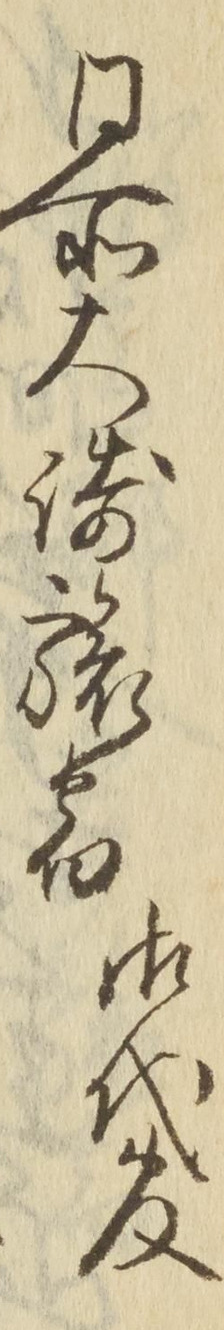同所大崎旅宿御代官
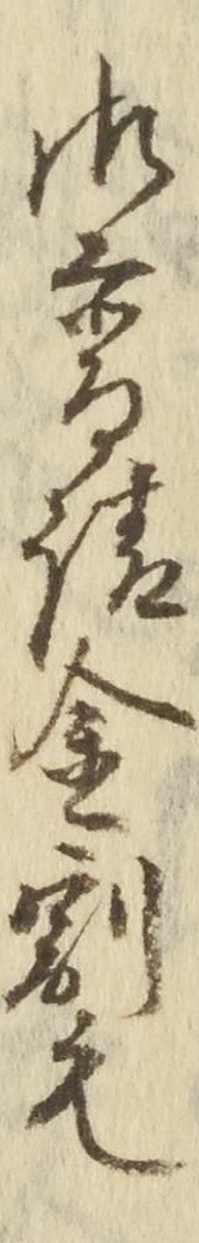御普請金割元
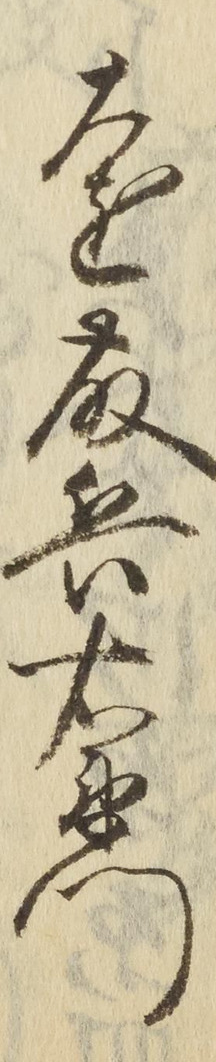遠藤兵右衛門
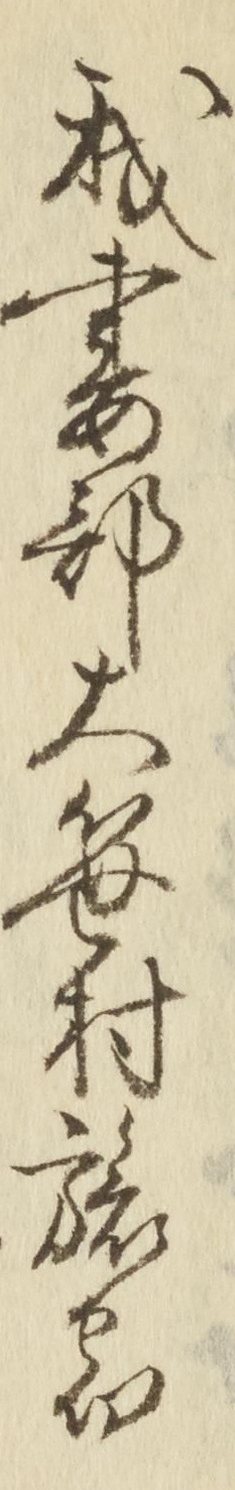我妻郡大笹村旅宿
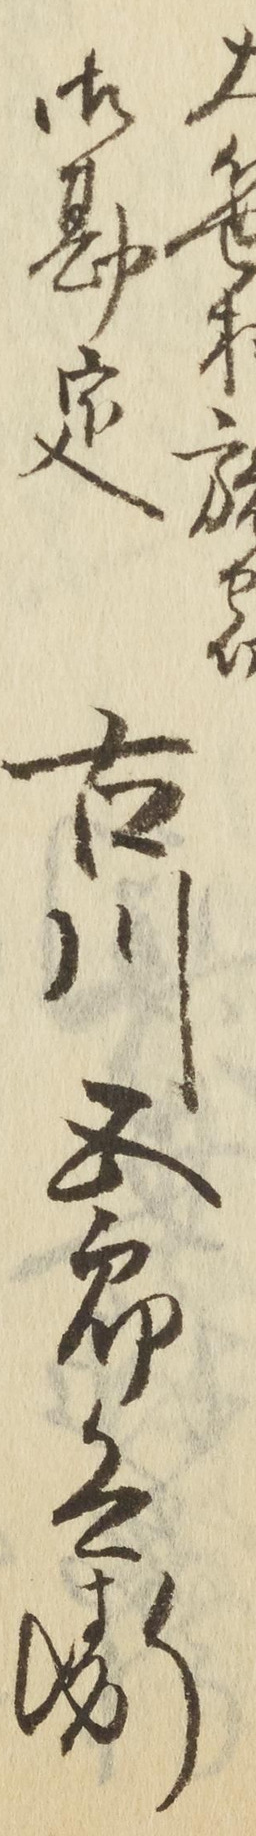御勘定古川五郎兵衛
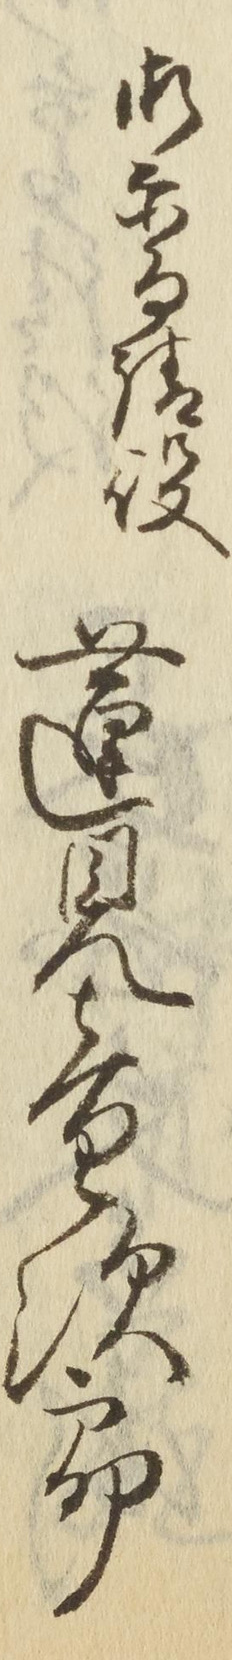御普請役蓮見吉次郎
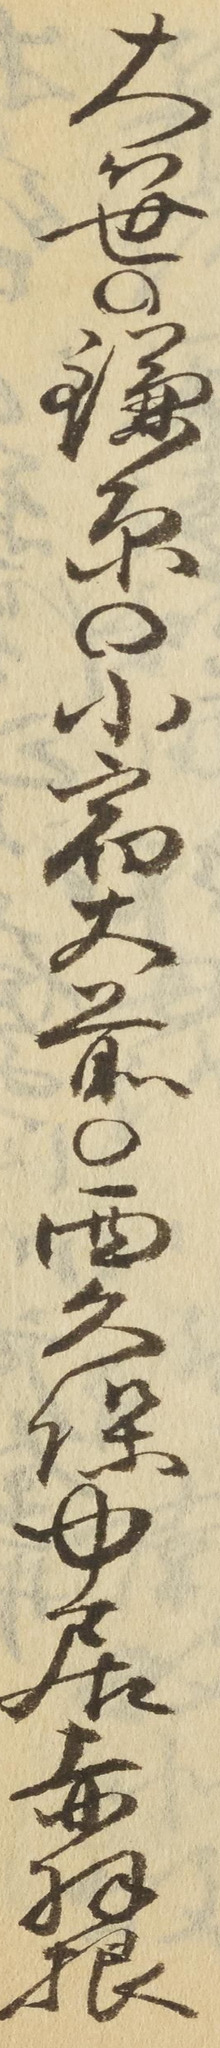大笹◯鎌原◯小宿大前◯西久保中居赤羽根

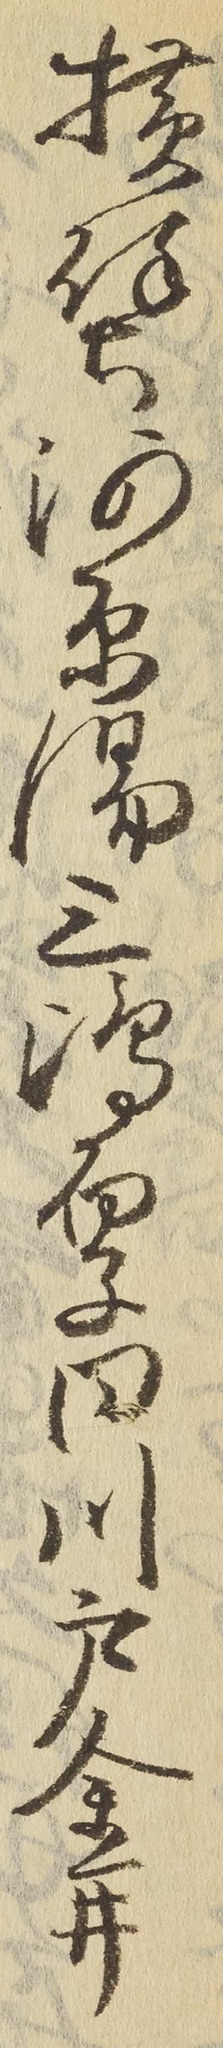横壁村河原湯三嶋原田川戸金井村
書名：浅間大變記
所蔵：東京大学地震研究所図書室 Earthquake Research Institute Library, The University of Tokyo, JAPAN
